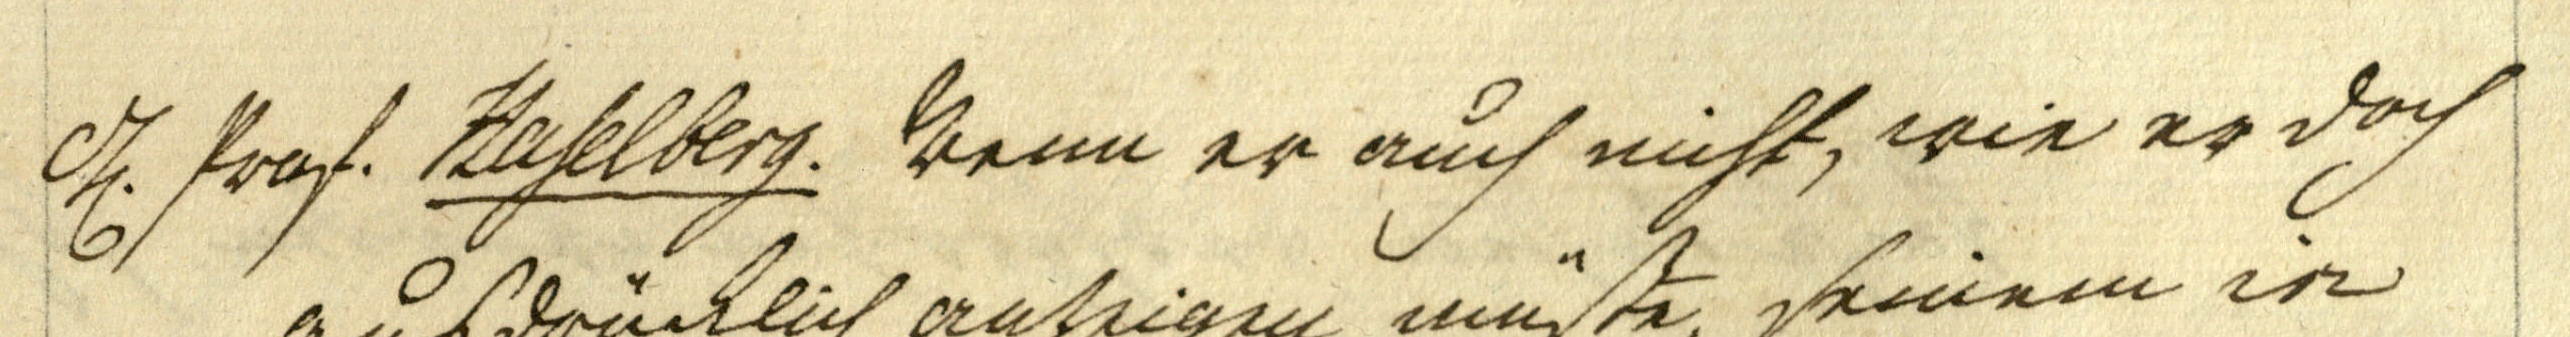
dh. Prof. Haselberg. Wenn er auch nicht, wie er doch
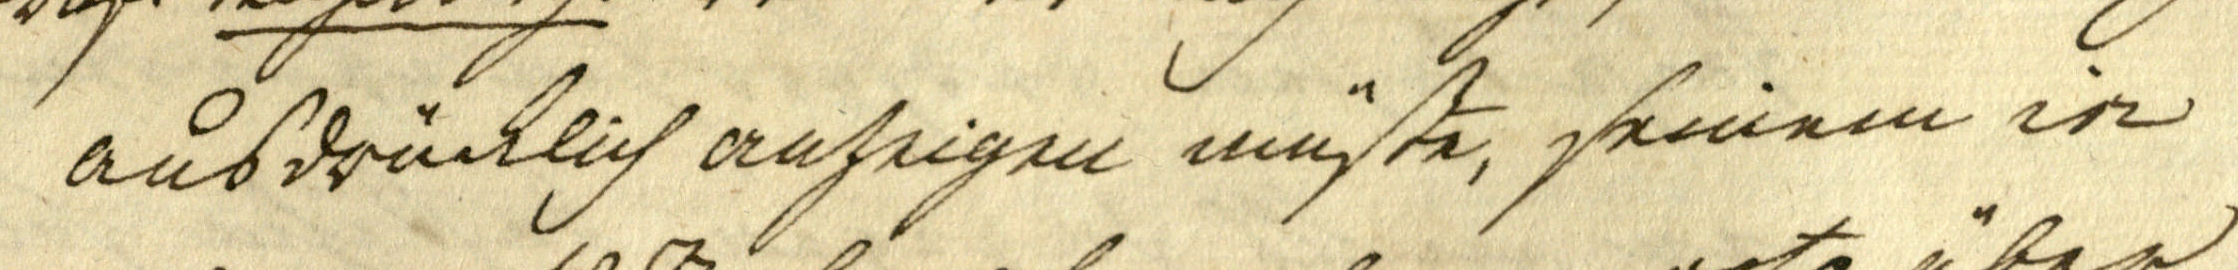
ausdrücklich anzeigen müßte, seinem in
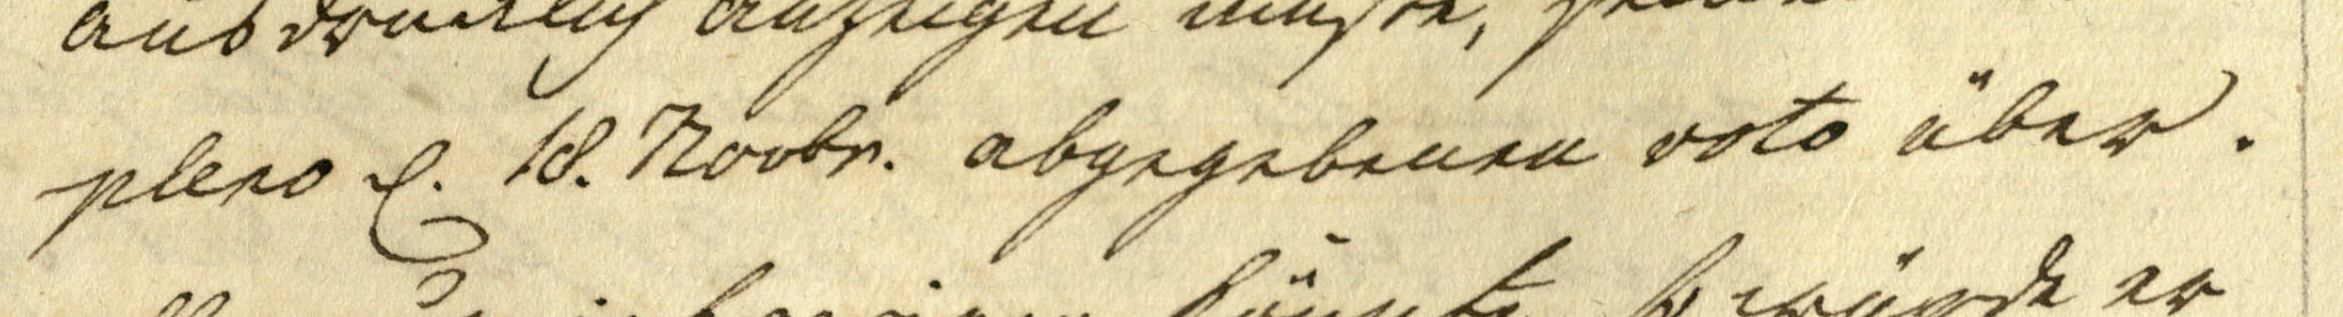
pleno d. 18. Novbr. abgegebenen voto über¬
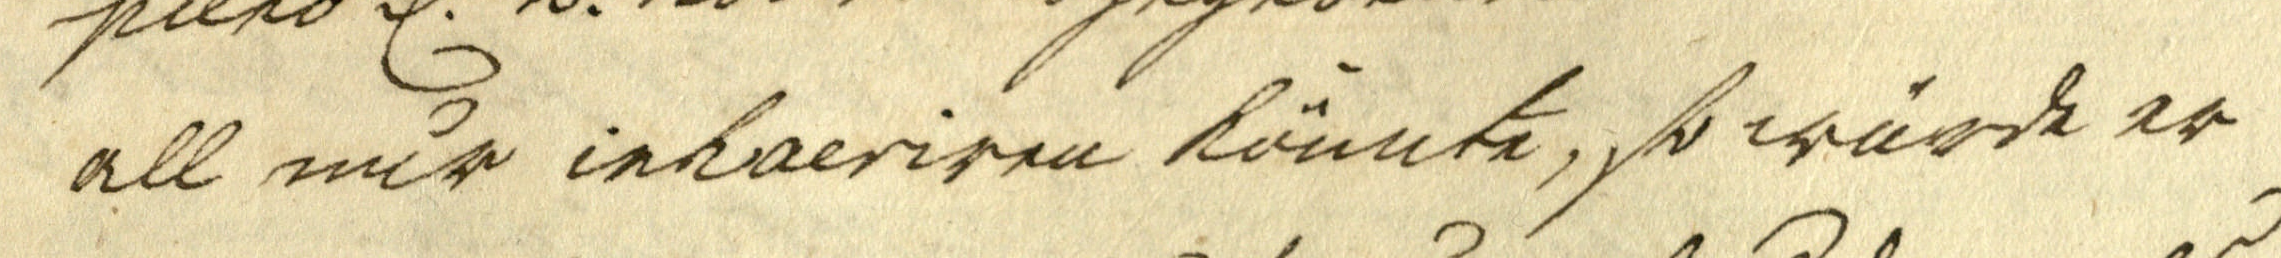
all nur inhaeriren könnte, so würde er
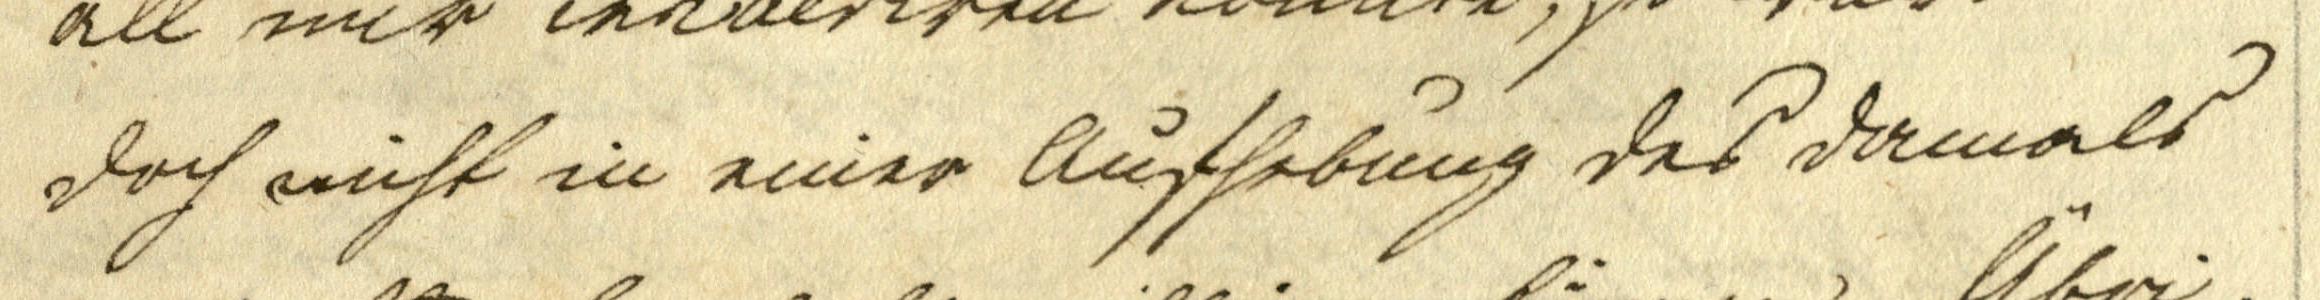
doch nicht in einer Aufhebung des damals
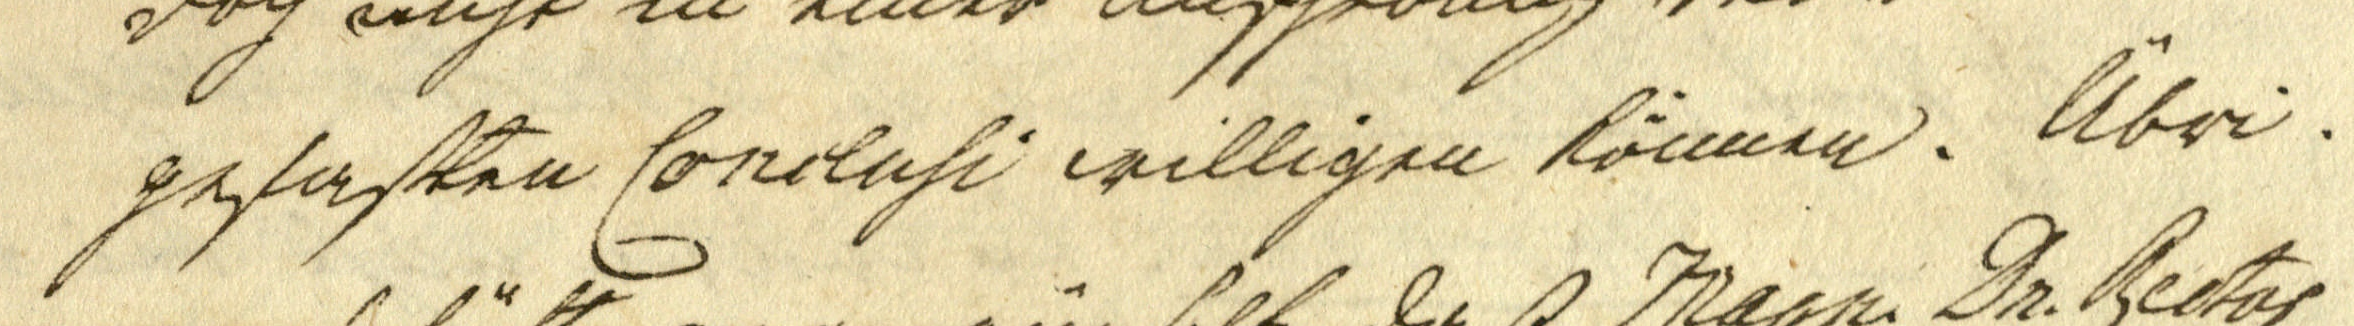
gefaßten Conclusi willigen können. Übri¬
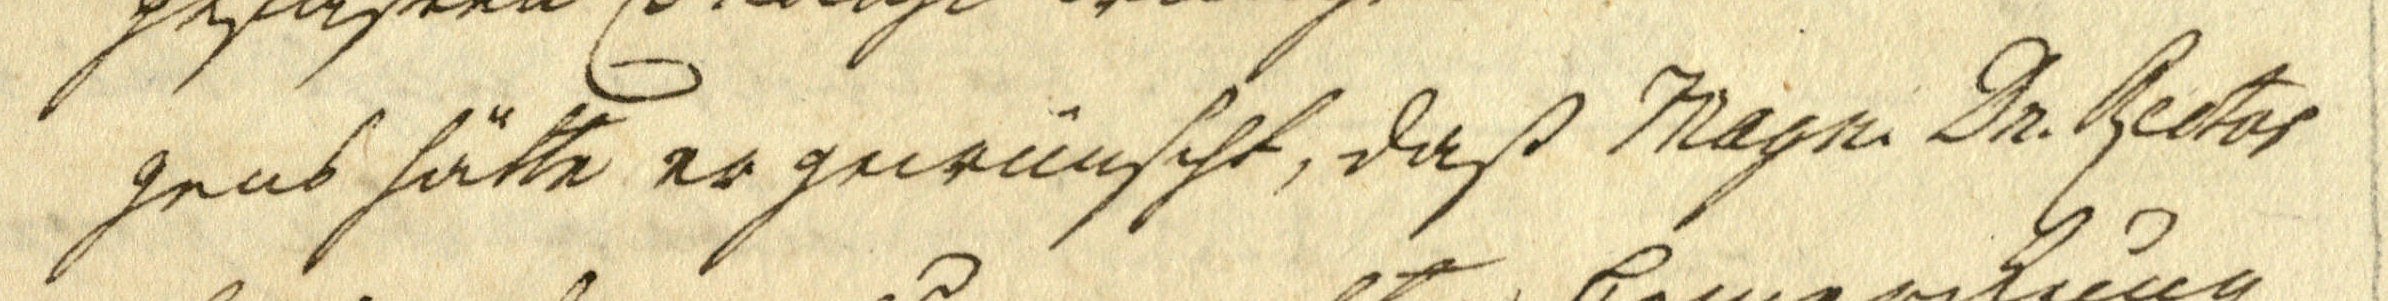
gens hätte er gewünscht, daß Magn. Dn. Rector
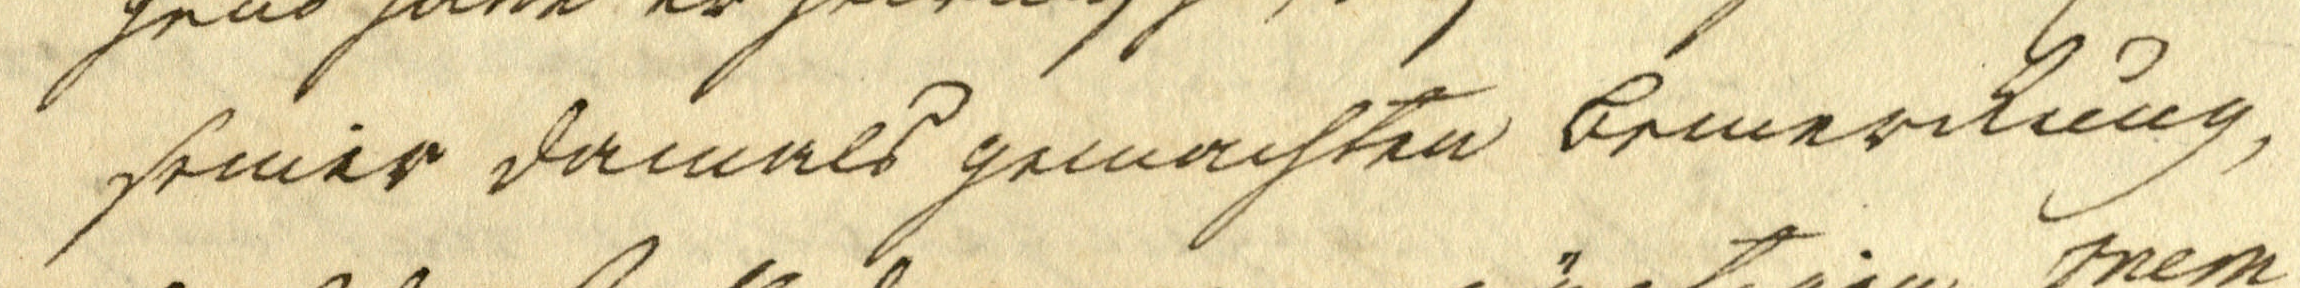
seiner damals gemachten Bemerckung,
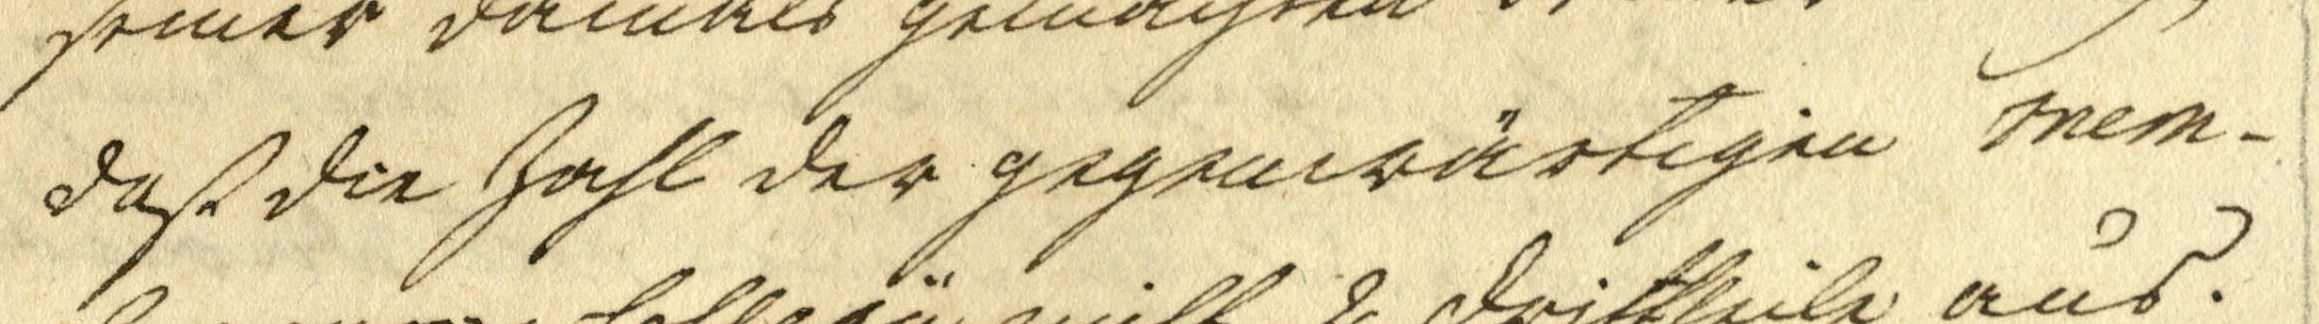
daß die Zahl der gegenwärtigen Mem¬
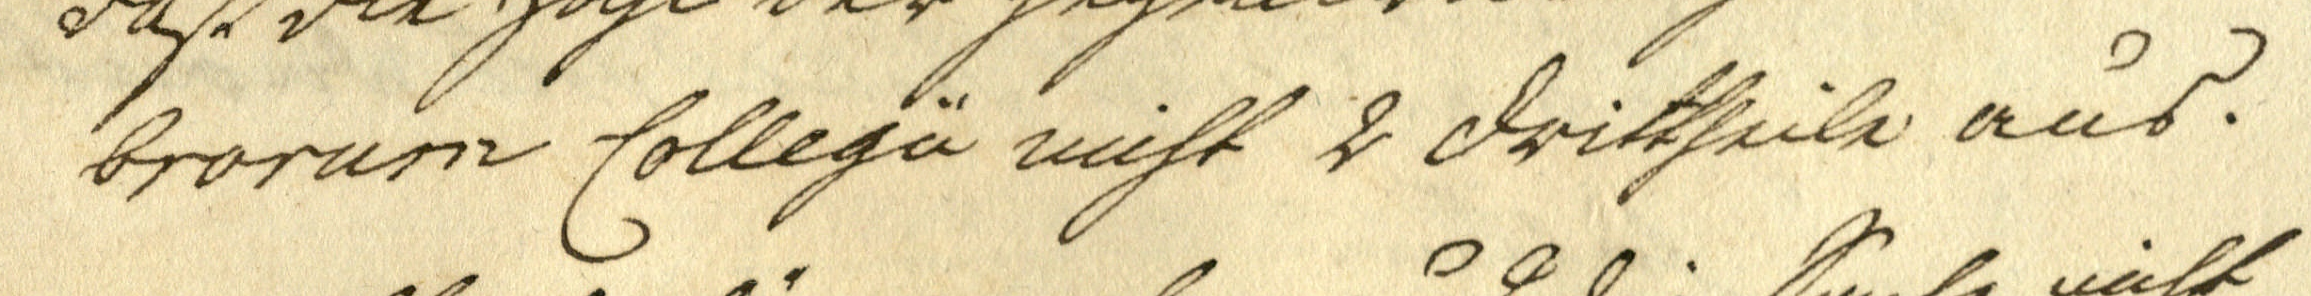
brorum Collegii nicht 2 Drittheile aus¬
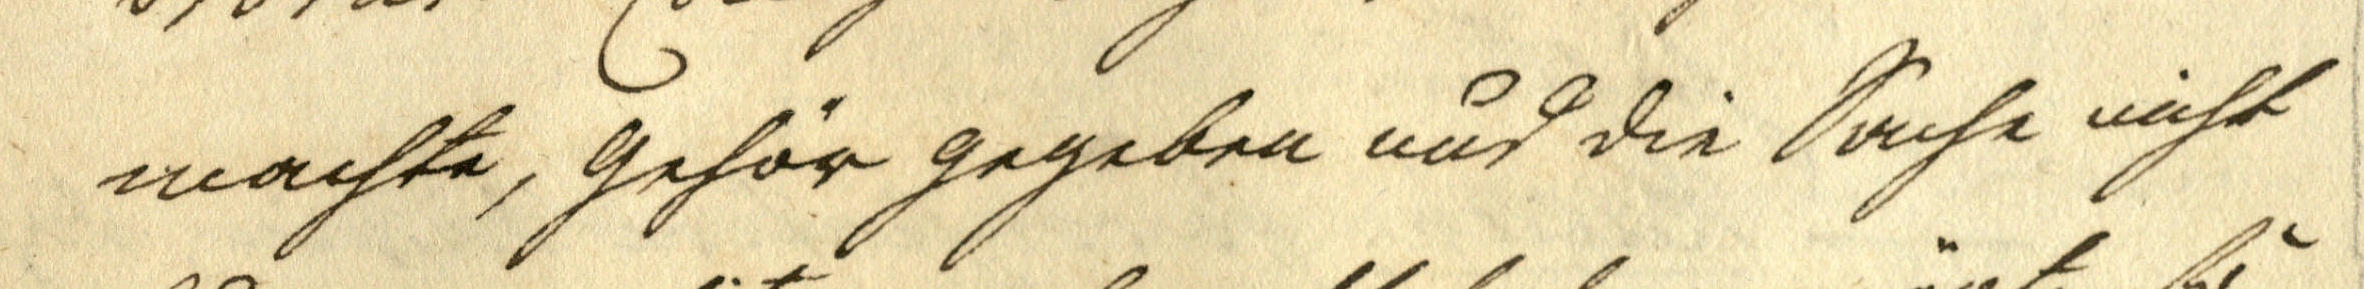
machte, Gehör gegeben und die Sache nicht
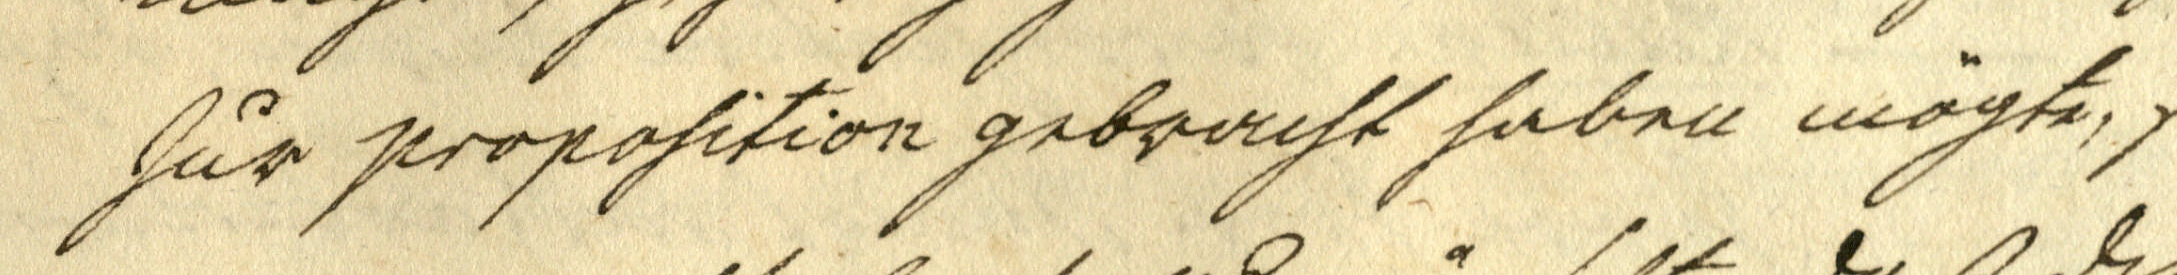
zur proposition gebracht haben mögte, so
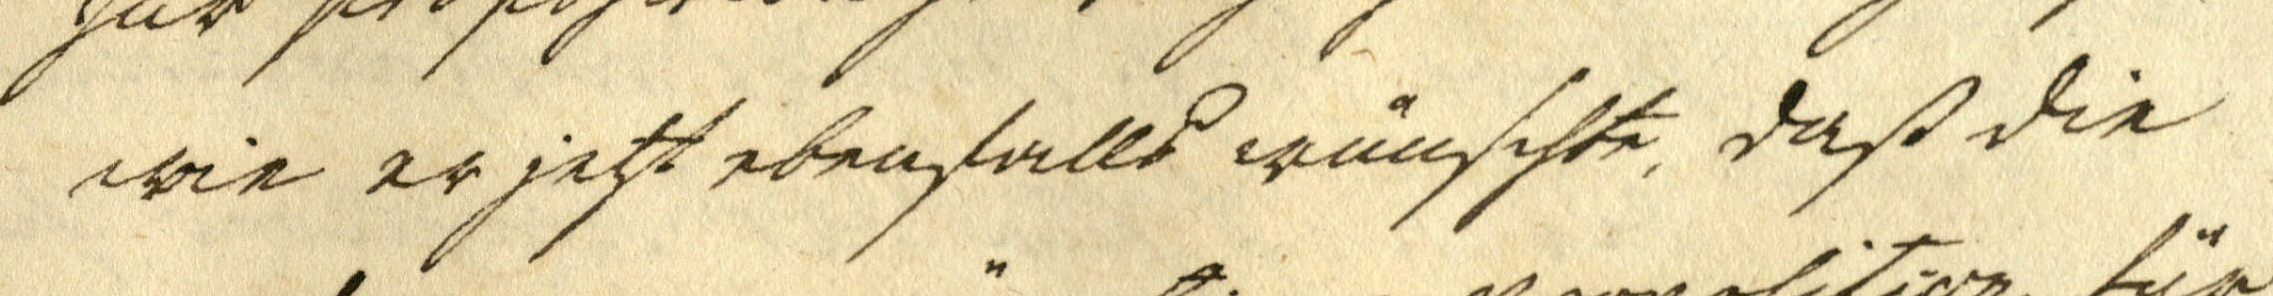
wie er jetzt ebenfalls wünschte, daß die
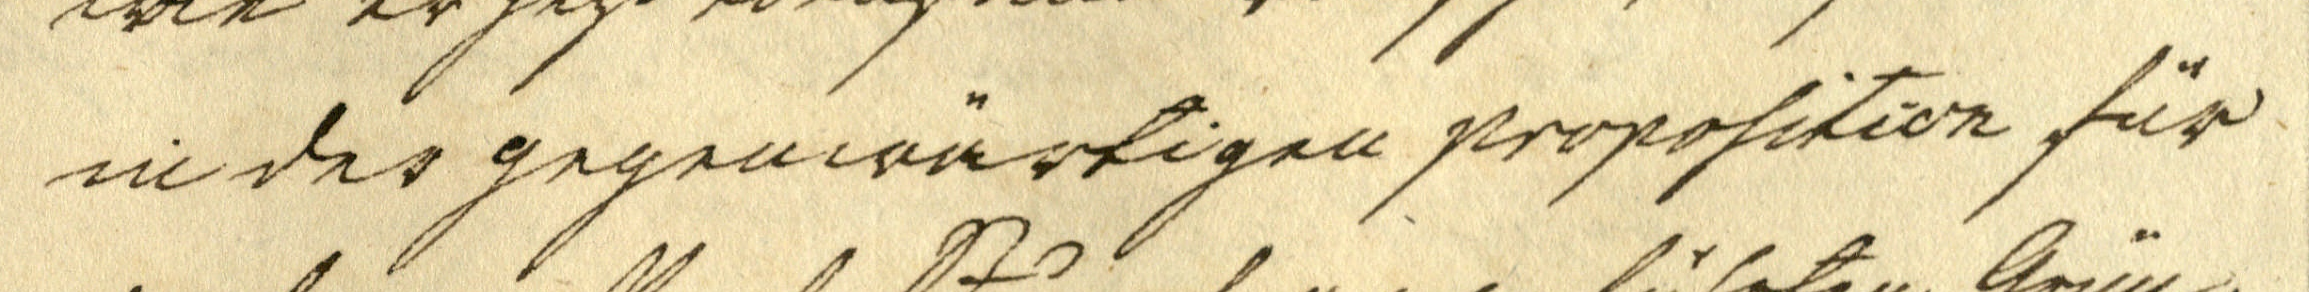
in der gegenwärtigen proposition für
